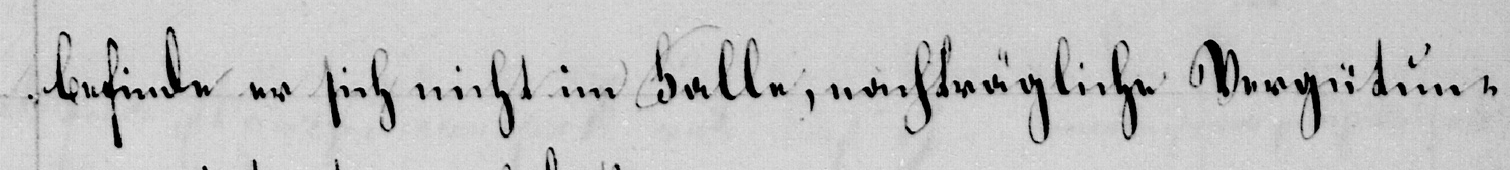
befinde er sich nicht im Falle, nachträgliche Vergütun¬
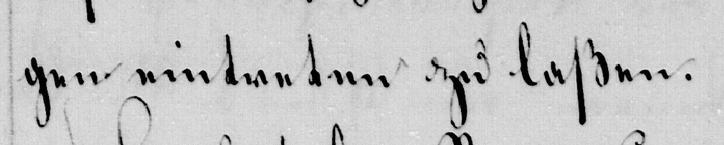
gen eintreten zu laßen.
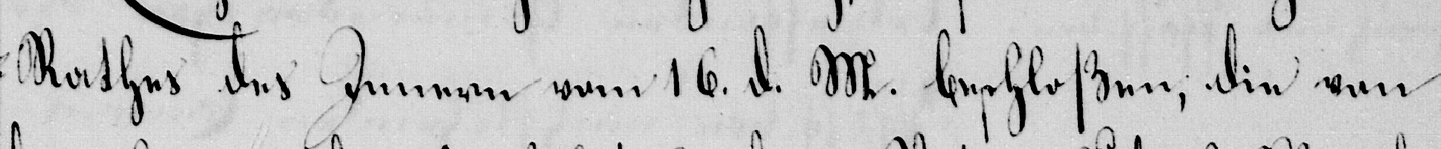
Rathes des Innern vom 16. d. M. beschloßen, die von
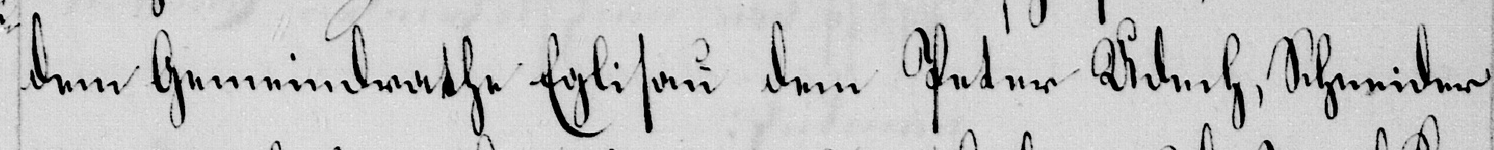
dem Gemeindrathe Eglisau dem Peter Udech, Schneider
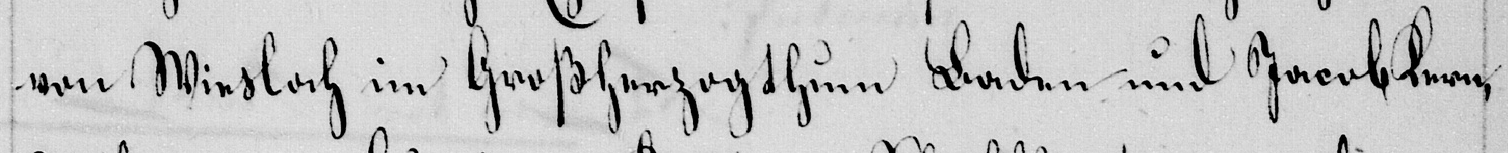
von Wieslach im Großherzogthum Baden und Jacob Kern,
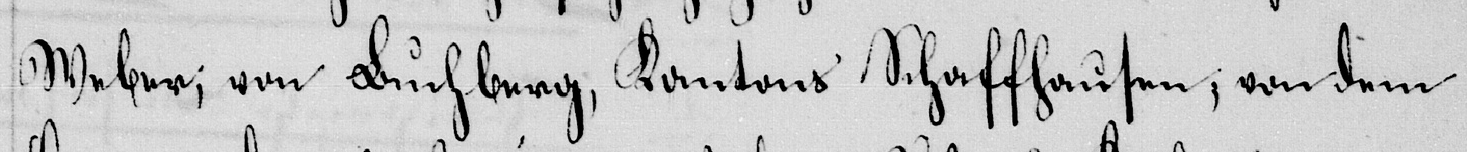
Weber von Buchberg, Kantons Schaffhausen; von dem
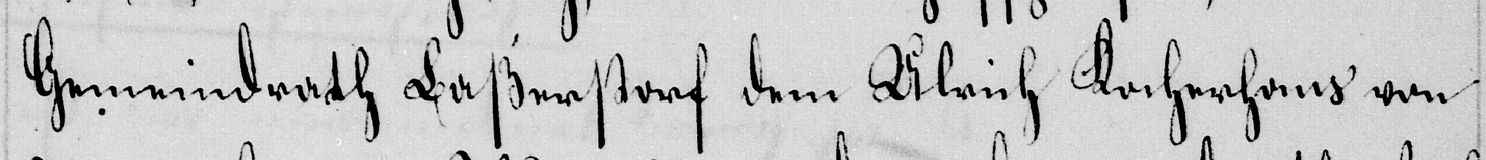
Gemeindrath Baßerstorf dem Ulrich Kocherhans von
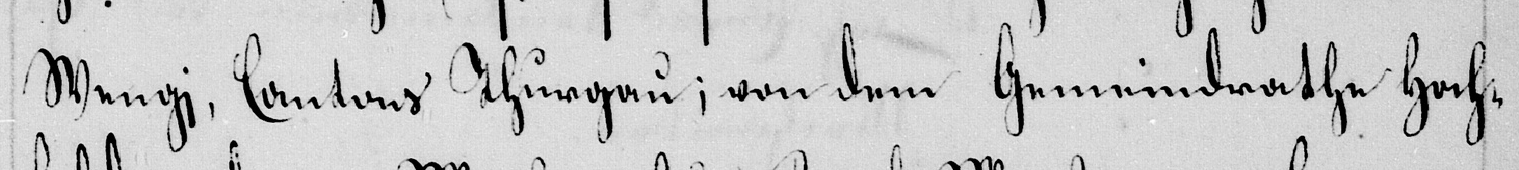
Wengi, Cantons Thurgau; von dem Gemeindrathe Hoch¬
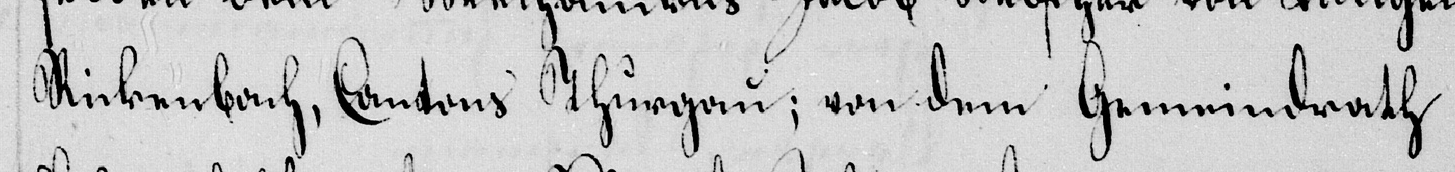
ickenbach, Cantons Thurgau; von dem Gemeindrath
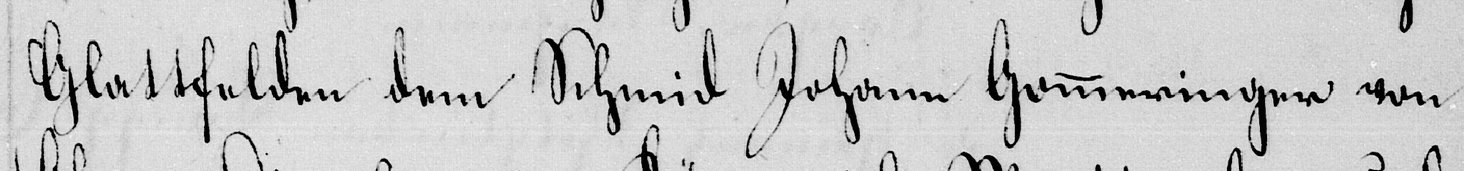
Glattfelden dem Schmid Johann Gommeringer von
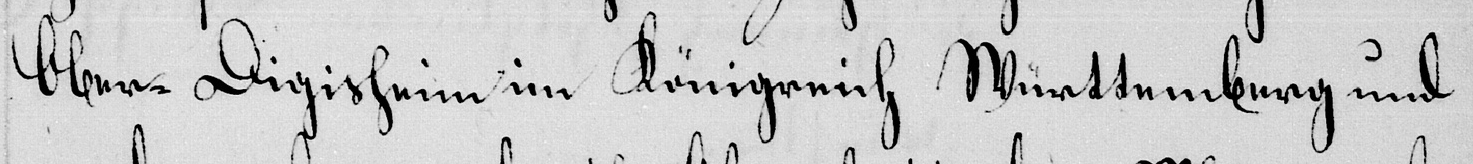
Ober-Digisheim im Königreich Württemberg und
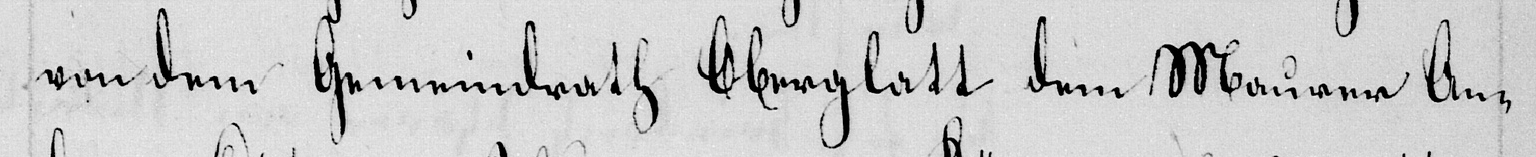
von dem Gemeindrath Oberglatt dem Maurer An¬
